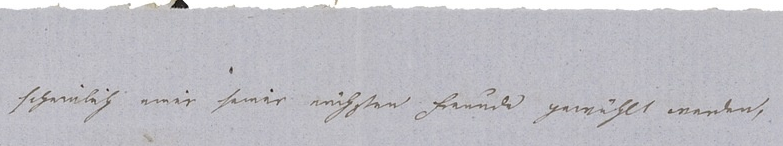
einer seiner nächsten
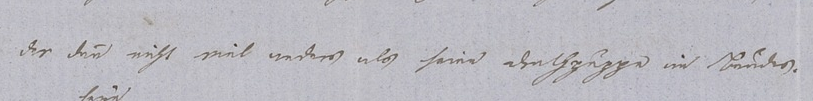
der dann nicht viel anders als seine Drathpuppe im Bundes-
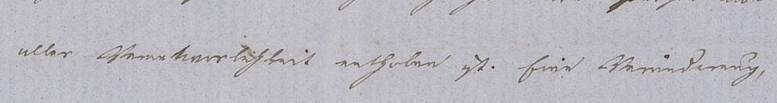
aller Verantwortlichkeit enthoben ist. Eine Veränderung,
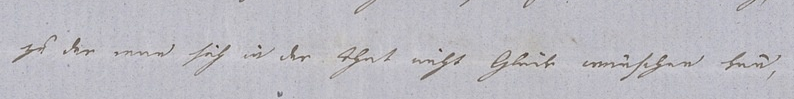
zu der man sich in der That nicht Glück wünschen kann,
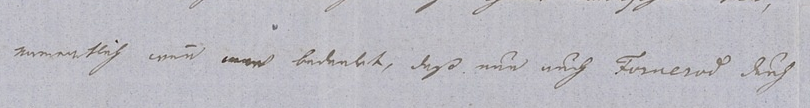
namentlich wenn man bedenkt, daß nun auch Fornerod durch
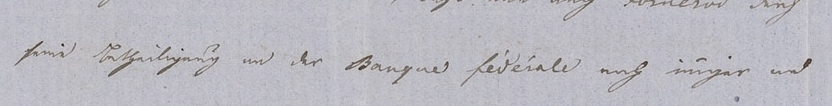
seine Betheiligung an der Banque Fédérale noch inniger an
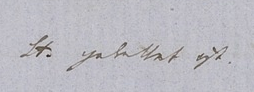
St. gekettet ist.
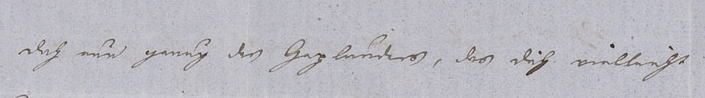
Doch nun genug des Geplauders, das Dich vielleicht
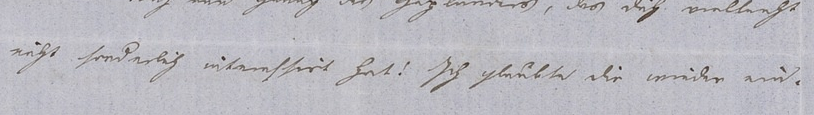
nicht sonderlich interessirt hat! Ich glaubte Dir wieder ein-
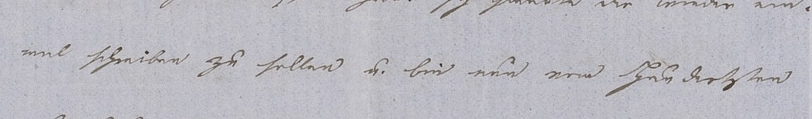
mal schreiben zu sollen u. bin nun vom Hundertsten
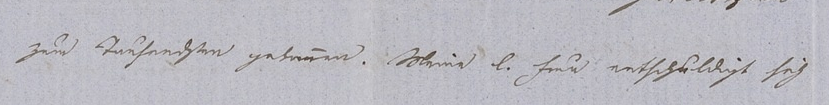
zum Tausendsten gekommen. Meine l. Frau entschuldigt sich
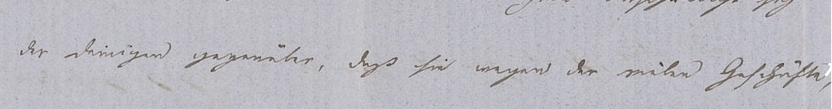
der Deinigen gegenüber, daß sie wegen der vielen Geschäfte,
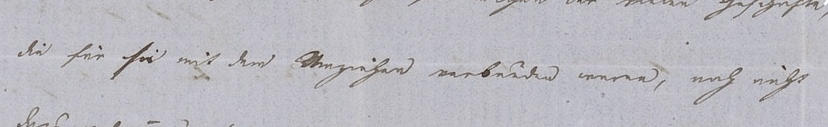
die für sie mit dem Umziehen verbunden waren, noch nicht
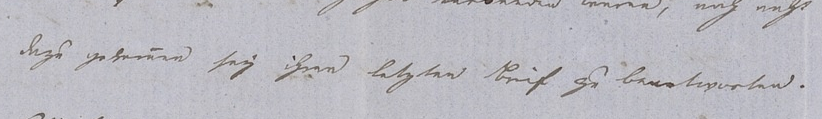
dazu gekommen sey ihren letzten Brief zu beantworten.
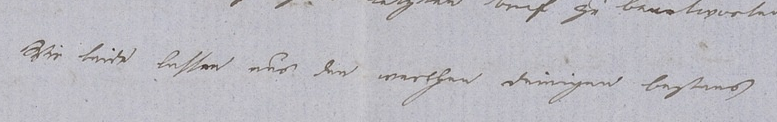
Wir beide lassen uns den werthen Deinigen bestens
